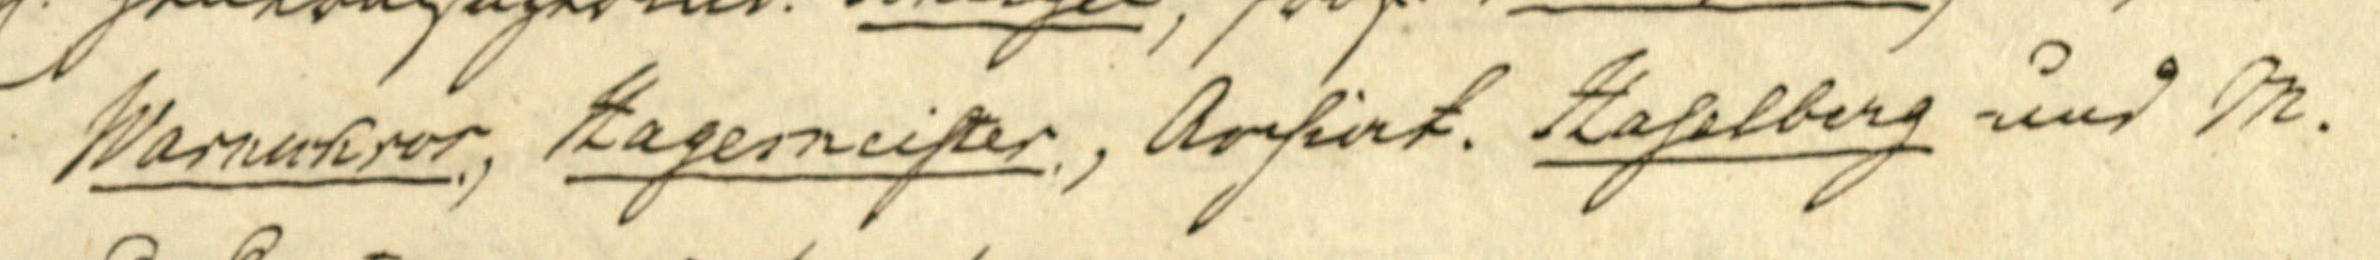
Warneckros, Hagemeister, Archiat. Haselberg und M.
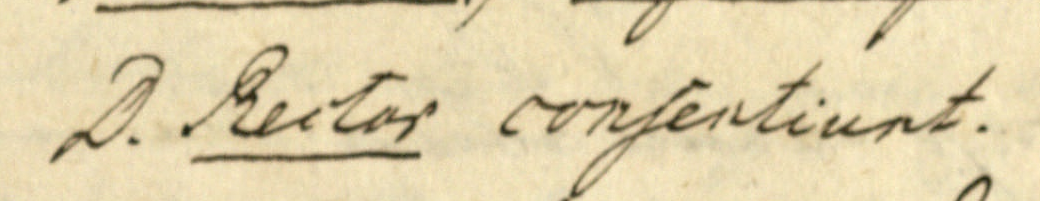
D. Rector consentiunt.
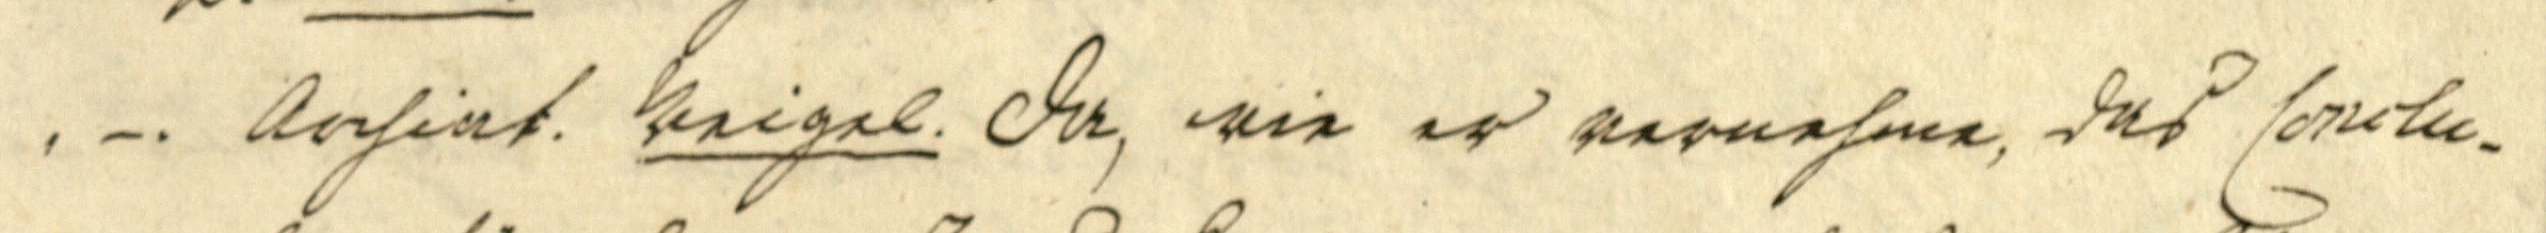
Archiat. Weigel. Da, wie er vernehme, das Conclu¬
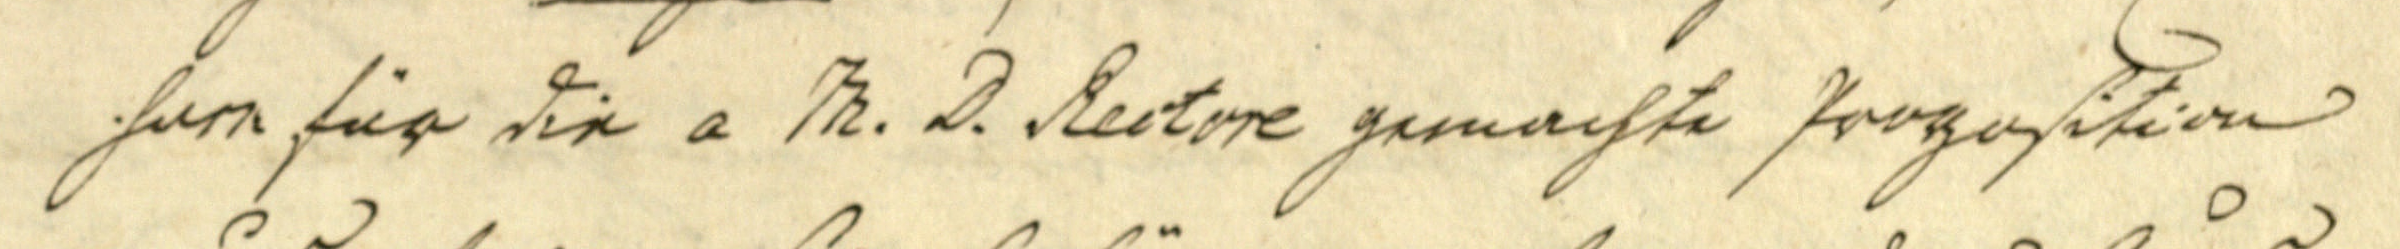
sum für die a M. D. Rectore gemachte Proposition
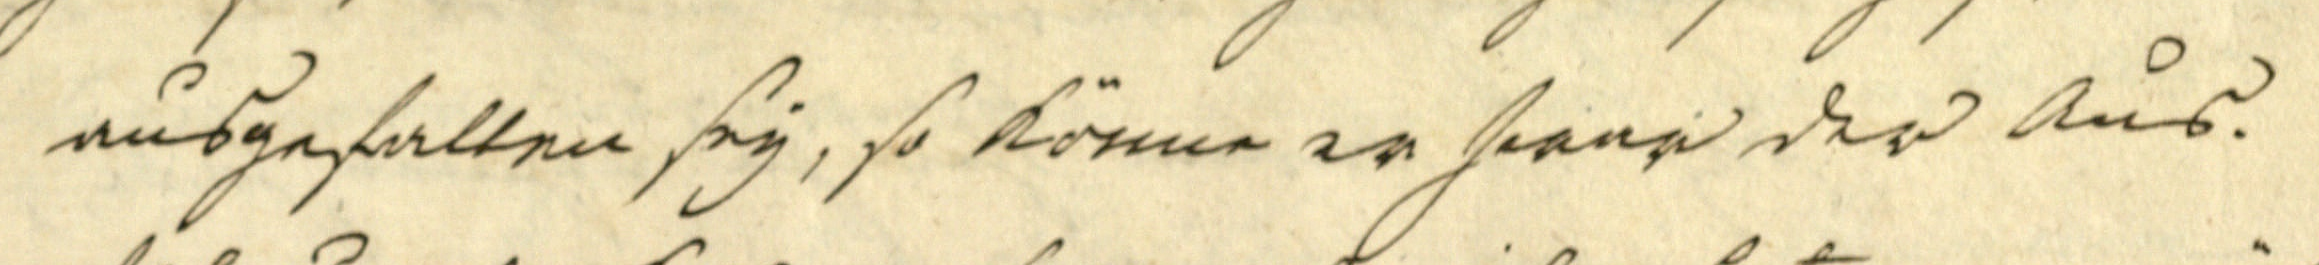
ausgefallen seÿ, so könne er zwar der Aus¬
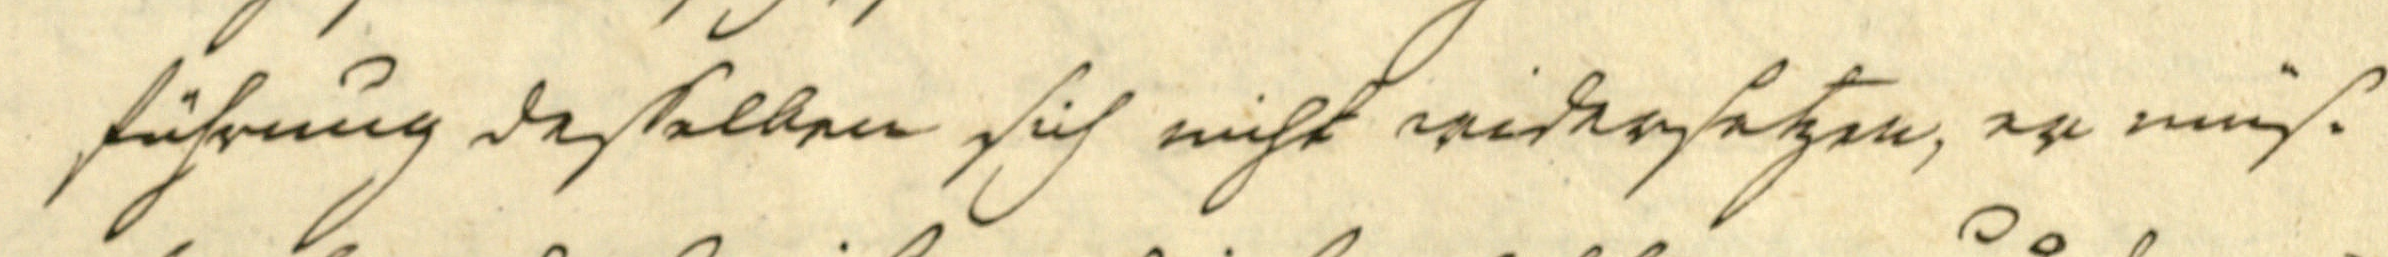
führung desselben sich nicht widersetzen, er müs¬
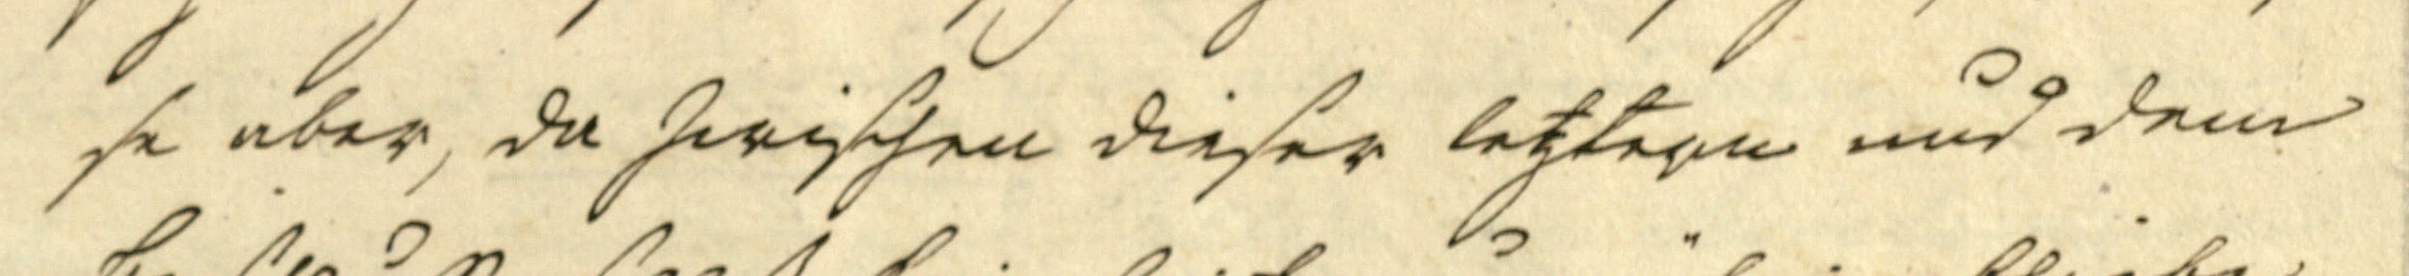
se aber, da zwischen dieser letztern und dem
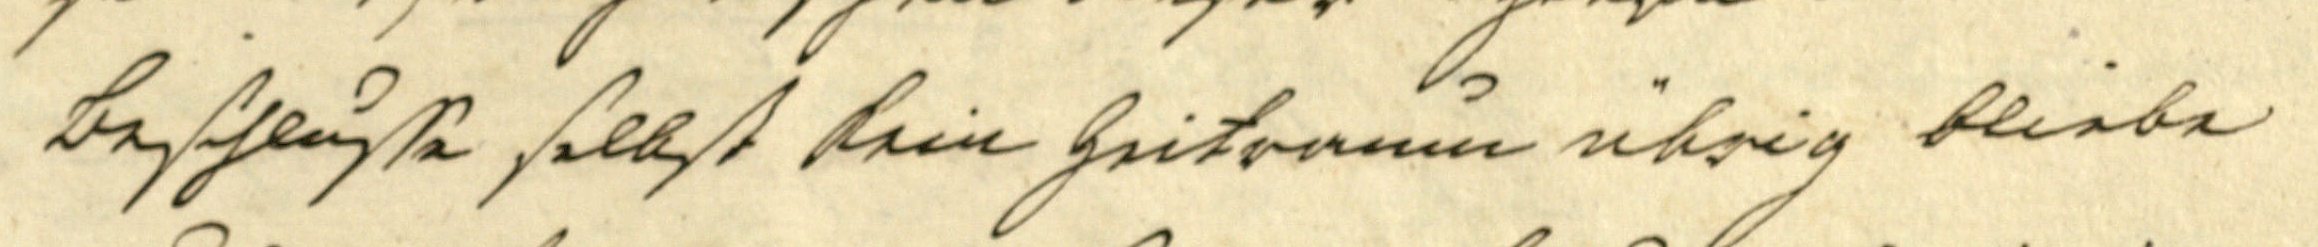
Beschlusse selbst kein Zeitraum übrig bliebe
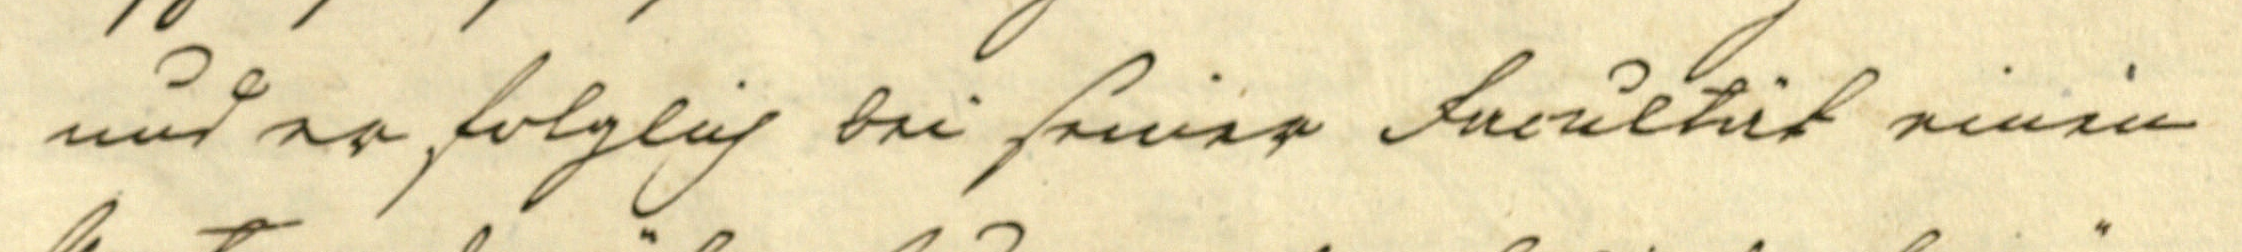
und er folglich bei seiner Facultät einen
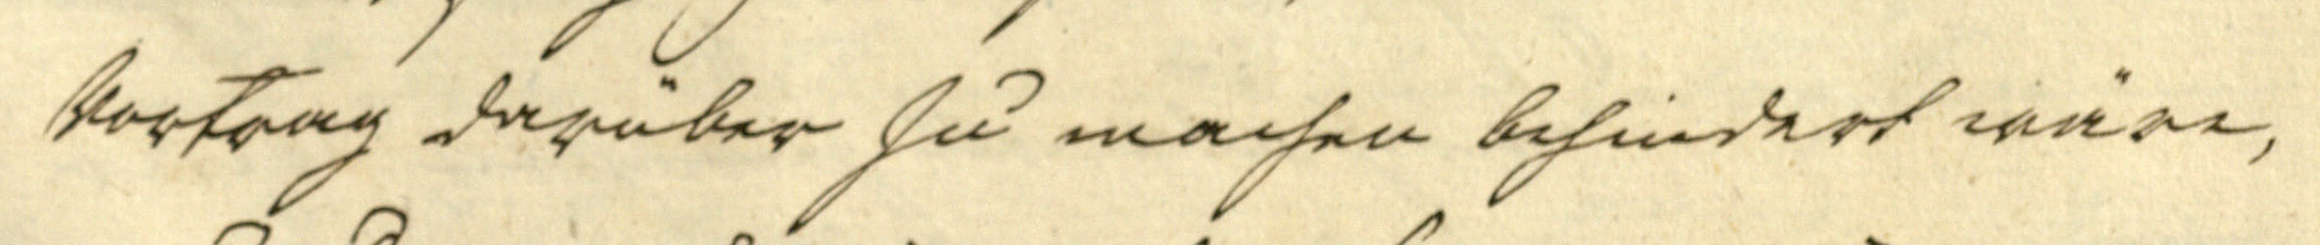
Vortrag darüber zu machen behindert wäre,
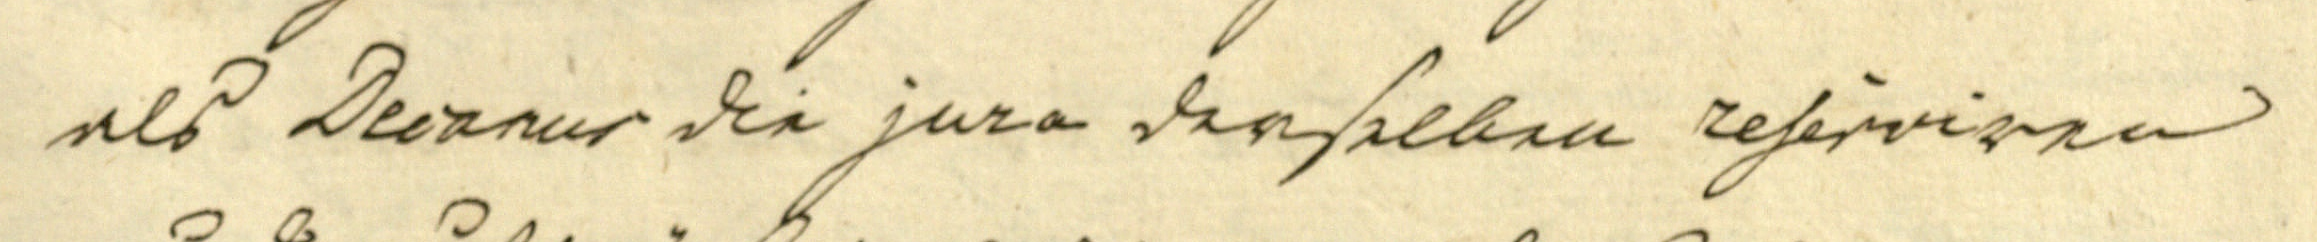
als Decanus die jura derselben reserviren
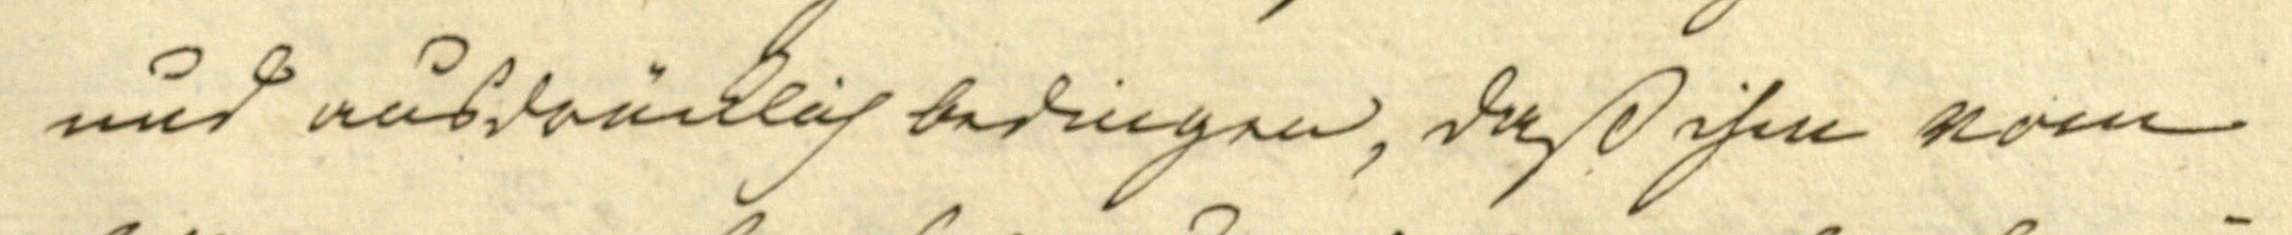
und ausdrücklich bedingen, daß ihm vom
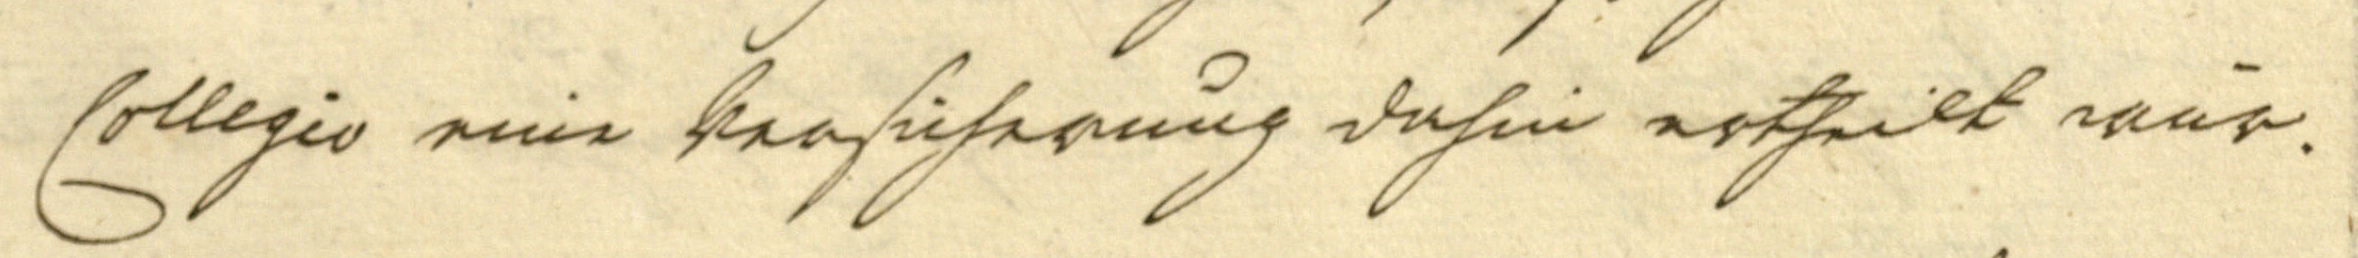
Collegio eine Versicherung dahin ertheilt wür¬
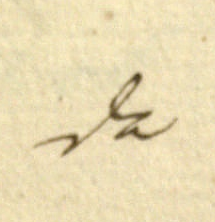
de
